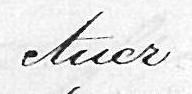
Auer
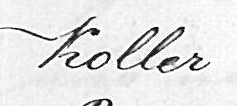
Koller
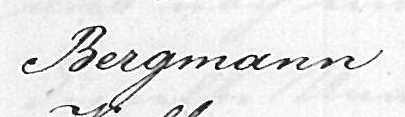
Bergmann
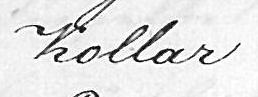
Kollar
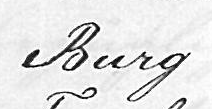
Burg
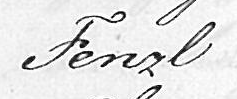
Fenzl
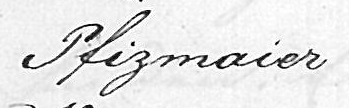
Pfizmaier
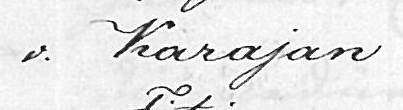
v. Karajan
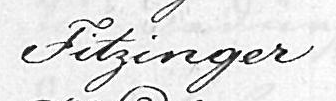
Fitzinger
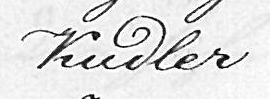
Kudler
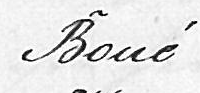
Boué
